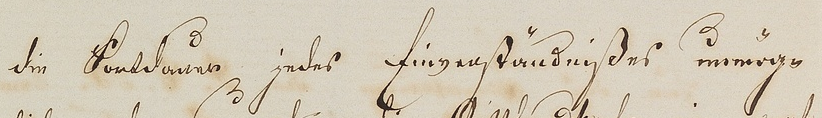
die Fortdauer jedes Einverständnißes unmög-
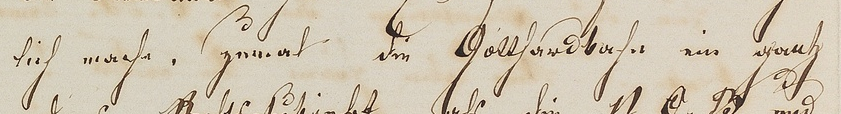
lich mache, zumal die Gotthardbahn ein gantz
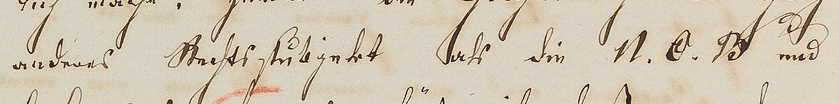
anderes Rechtssubjekt als die N.O.B. und
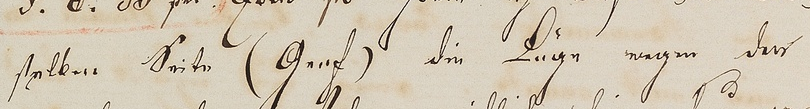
selben Seite (Genf) die Lüge wegen den
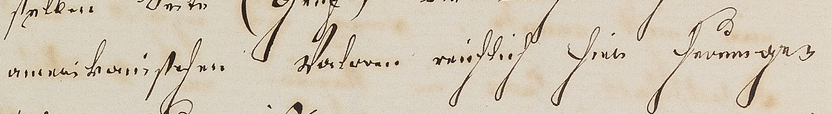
amerikanischen Valoren wirklich hier herumge-
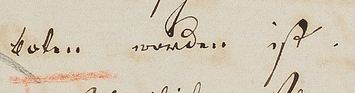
boten worden ist.
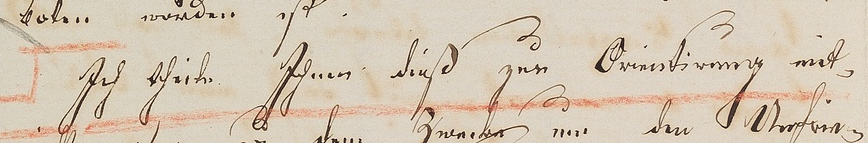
Ich theile Ihnen dieß zur Orientirung mit,
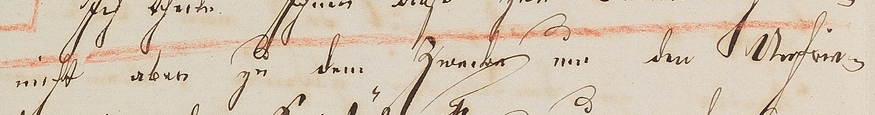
nicht aber zu dem Zwecke um den Unfrie-
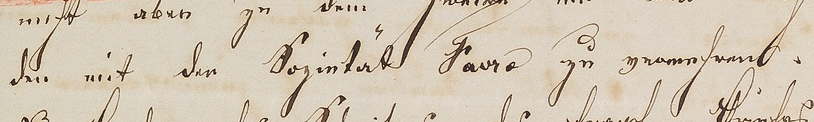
den mit der Sozietät Favre zu vermehren.
